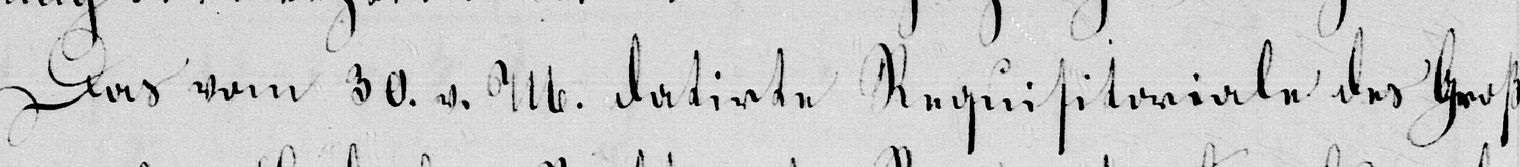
Das vom 30. v. M. datirte Requisitioriale des Großh¬
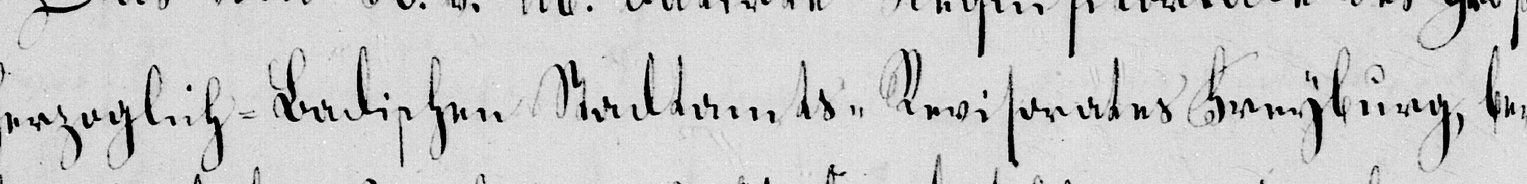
erzoglich-Badischen Stadtamts-Revisorates Freyburg, be¬
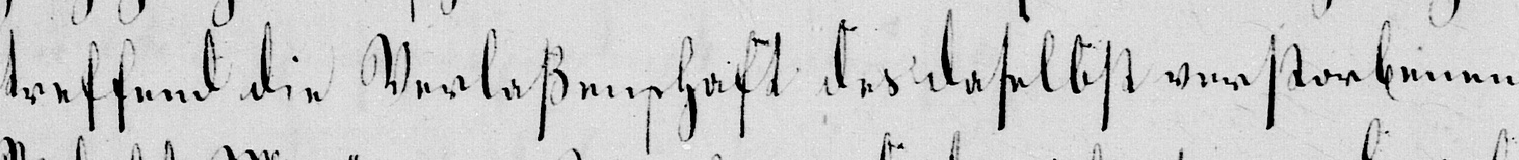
treffend die Verlaßenschaft des daselbst verstorbenen
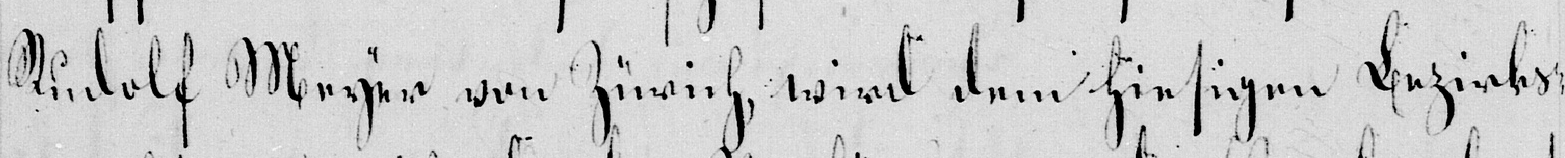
Rudolf Meyer von Zürich, wird dem hiesigen Bezirks¬
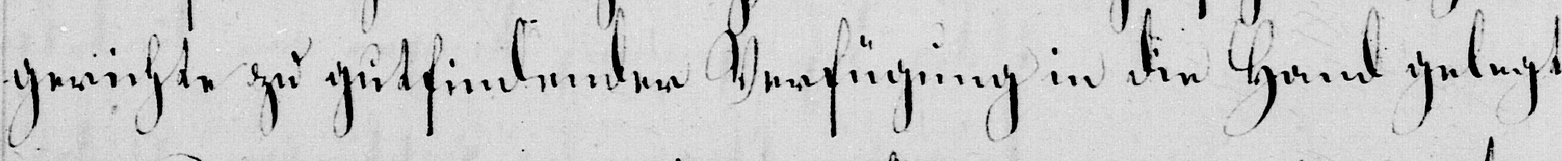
gerichte zu gutfindender Verfügung in die Hand gelegt.
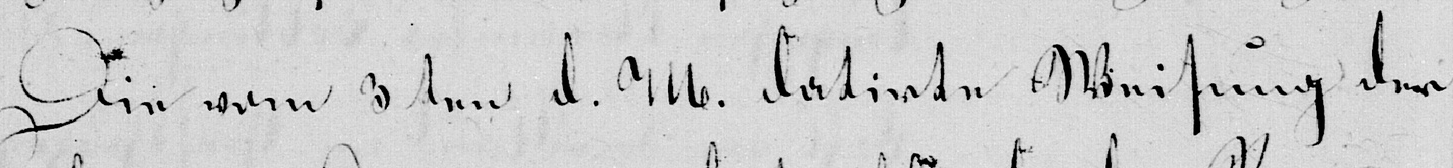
Die vom 3ten d. M. datirte Weisung der
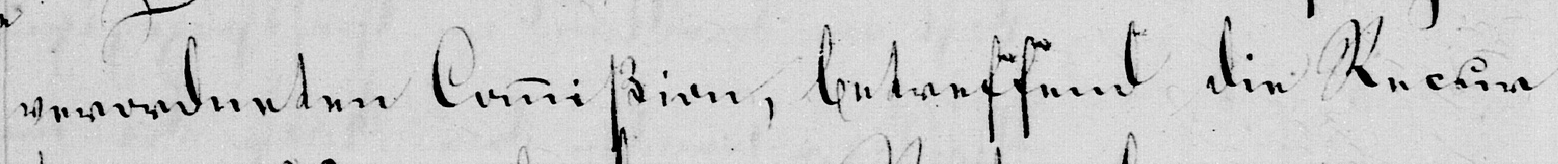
verordneten Commißion, betreffend die Recur¬
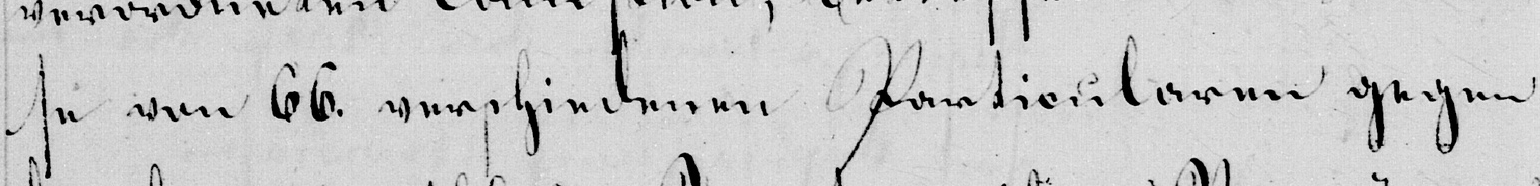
se von 66. verschiedenen Particularen gegen
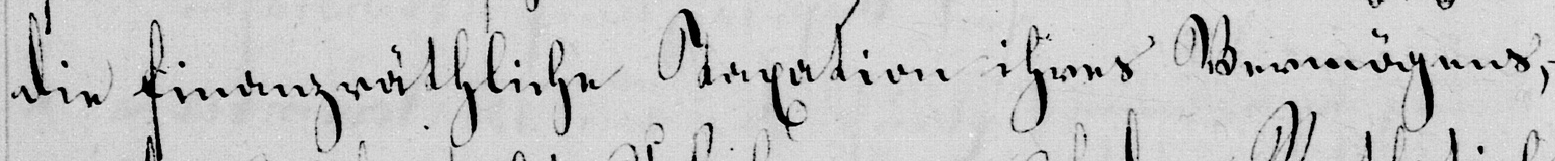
die finanzräthliche Taxation ihres Vermögens,
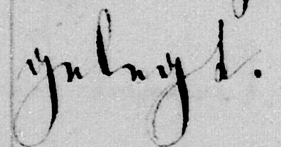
gelegt.
